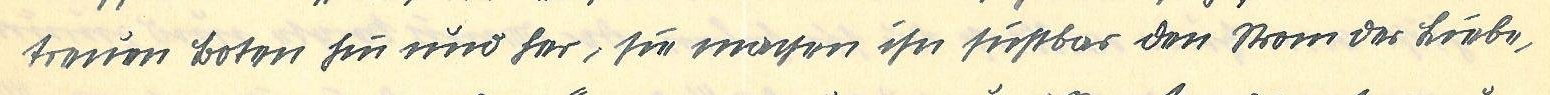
treuen Boten hin und her, sie machen ihn sichtbar den Strom der Liebe,
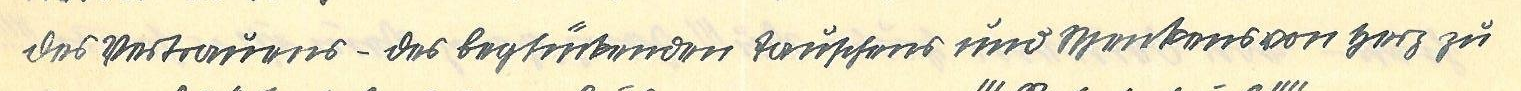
des Vertrauens – des beglückenden Tauschens und Schenkens von Herz zu
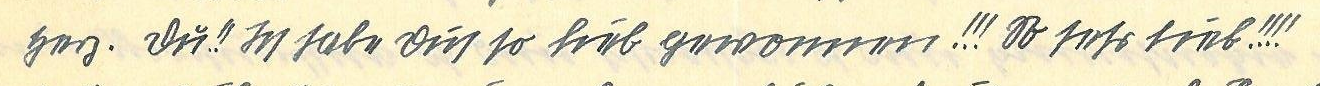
Herz. Du!! Ich habe Dich so lieb gewonnen!!! So sehr lieb!!!!
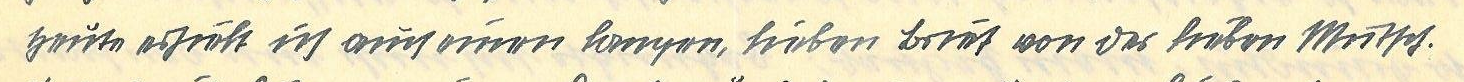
Heute erhielt ich auch einen langen, lieben Brief von der lieben Mutsch.
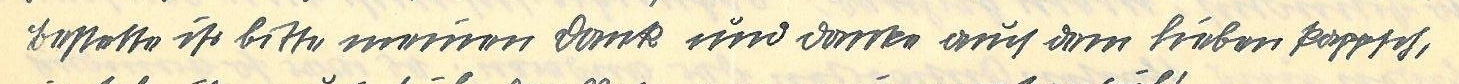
Bestelle ihr bitte meinen Dank und danke auch dem lieben Pappsch,
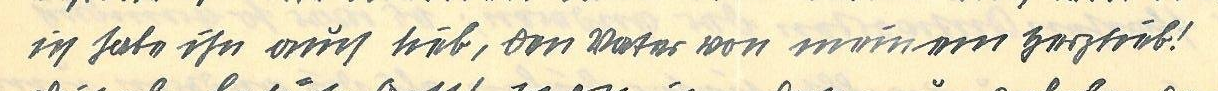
ich habe ihn auch lieb, den Vater von meinem Herzlieb!
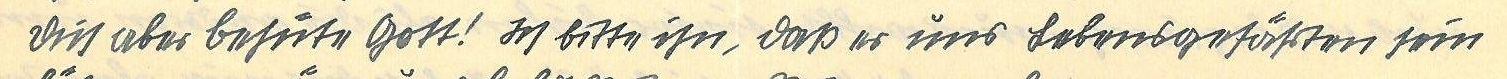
Dich aber behüte Gott! Ich bitte ihn, daß er uns Lebensgefährten sein
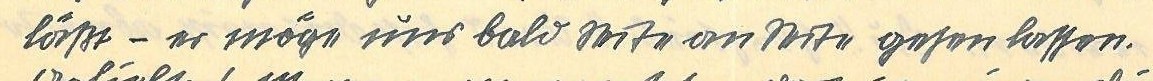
läßt – er möge uns bald Seite an Seite gehen lassen.
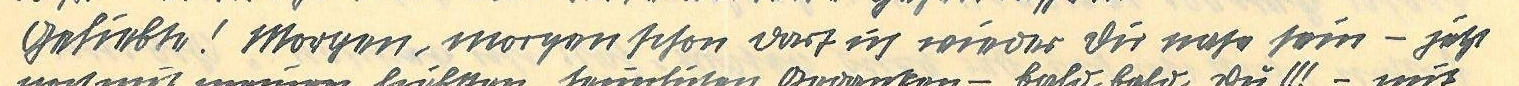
Geliebte! Morgen, morgen schon darf ich wieder Dir nahe sein – jetzt
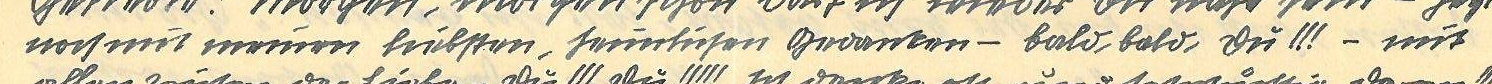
noch mit meinen liebsten, heimlichen Gedanken – bald, bald, Du!!! – mit
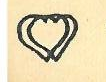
♥♥
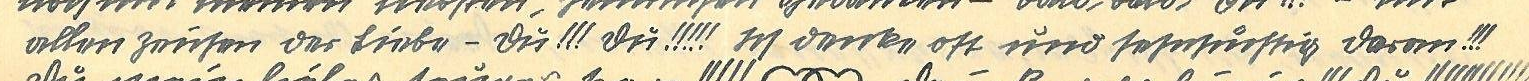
allen Zeichen der Liebe – Du!!! Du!!!!! Ich denke oft und sehnsüchtig daran!!!
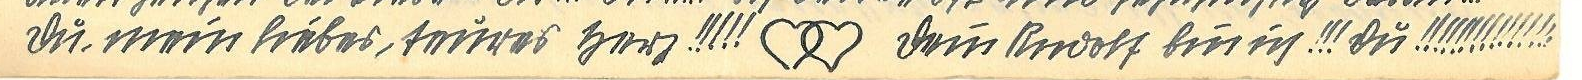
Du, mein liebes, teures Herz!!!!! ♥♥ Dein Rudolf bin ich!!! Du!!!!!!!!!!!!!!!
